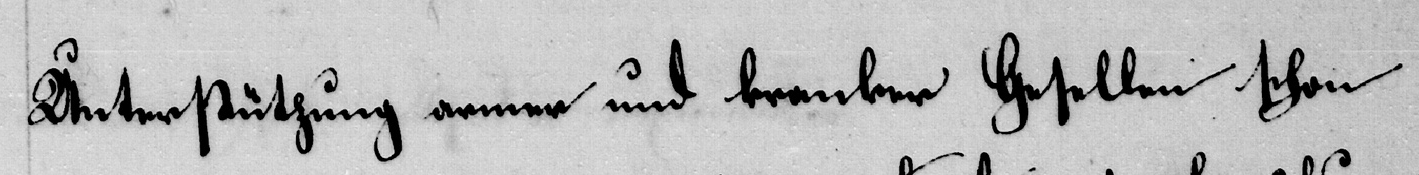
Unterstützung armer und kranker Gesellen schon
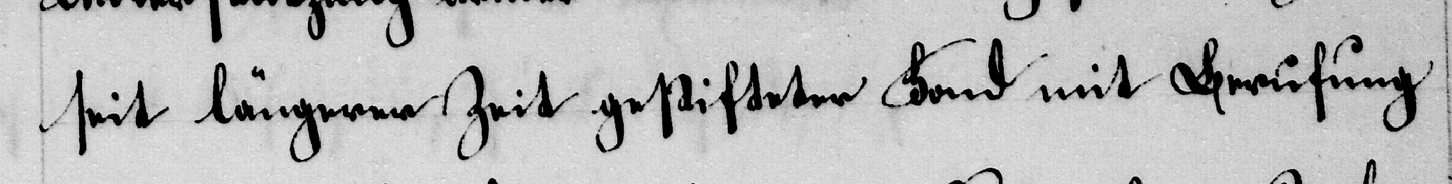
seit längerer Zeit gestifteten Fond mit Berufung
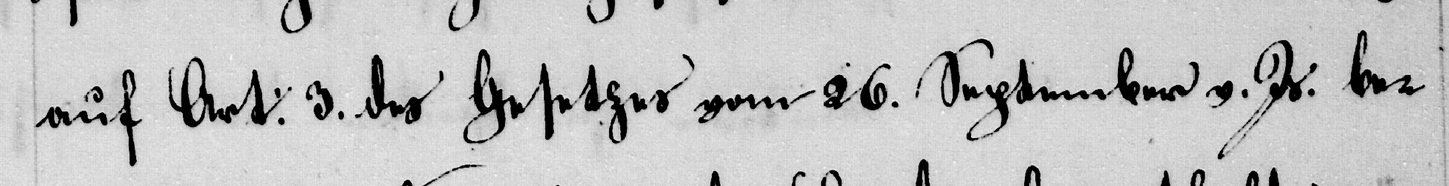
auf Art: 3. des Gesetzes vom 26. September v. Js. be¬
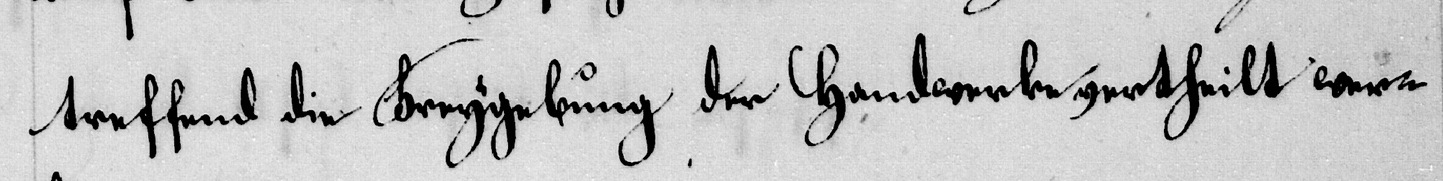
treffend die Freygebung der Handwerke vertheilt wer¬
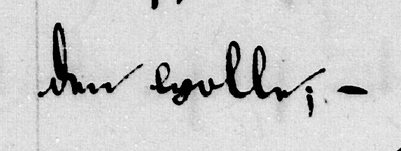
den wolle: –
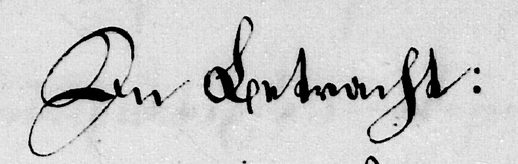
In Betracht:
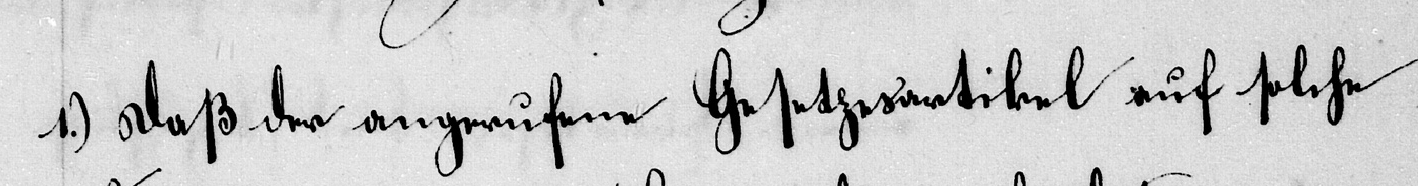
1.) Daß der angerufene Gesetzesartikel auf solche
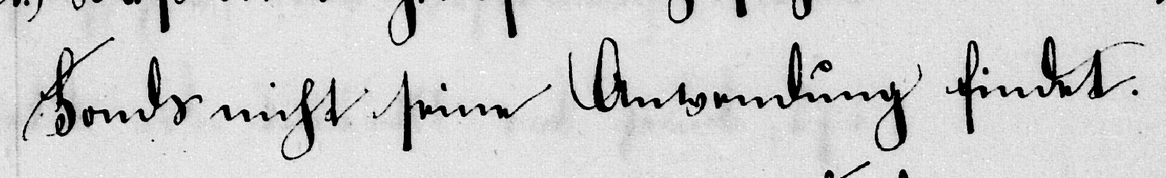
Fonds nicht seine Anwendung findet.
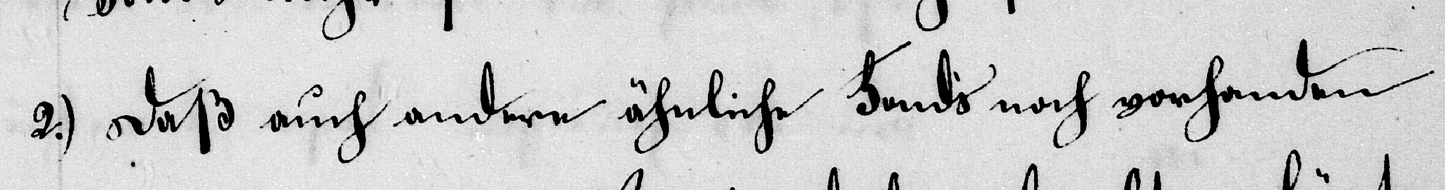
2.) Daß auch andere ähnliche Fonds noch vorhanden
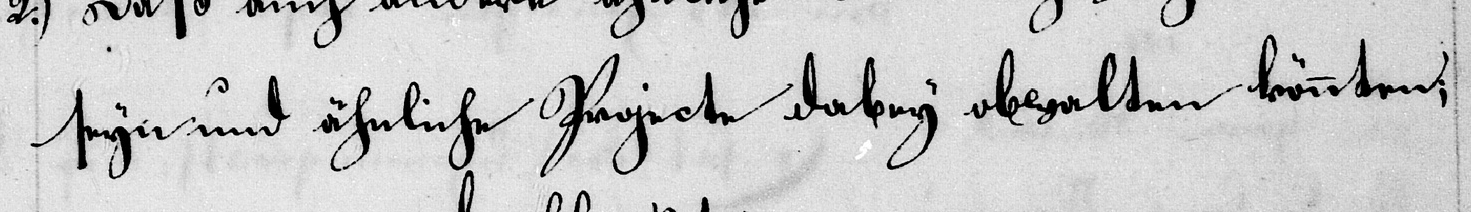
seyn und ähnliche Projecte dabey obwalten könnten;
